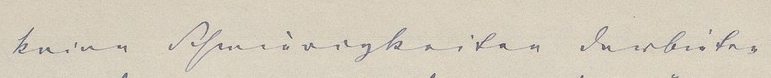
keine Schwierigkeiten darbieten
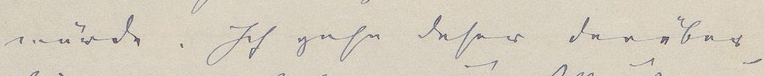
würde. Ich gehe daher darüber
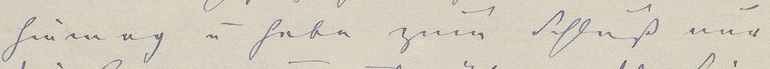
hinweg u habe zum Schluß nur
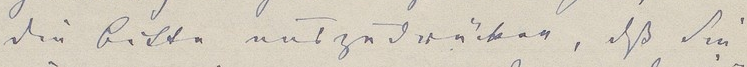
die Bitte auszudrücken, daß Sie
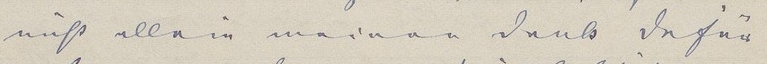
nicht allein meinen Dank dafür
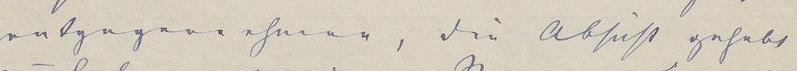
entgegennehmen, die Absicht gehabt
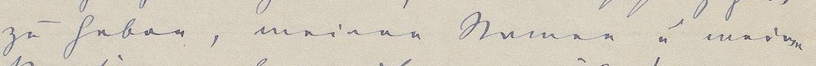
zu haben, meinen Namen u meine
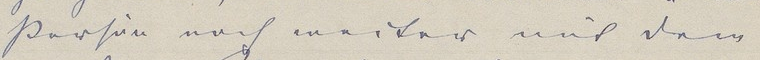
Person noch weiter mit dem
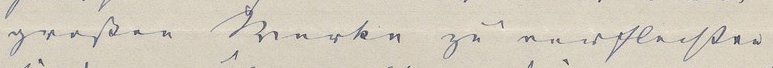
großen Werke zu verflechten,
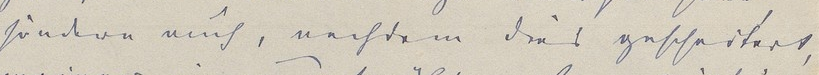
sondern auch, nachdem dies gescheitert,
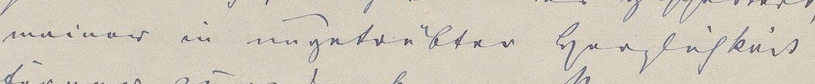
meiner in ungetrübter Herzlichkeit
